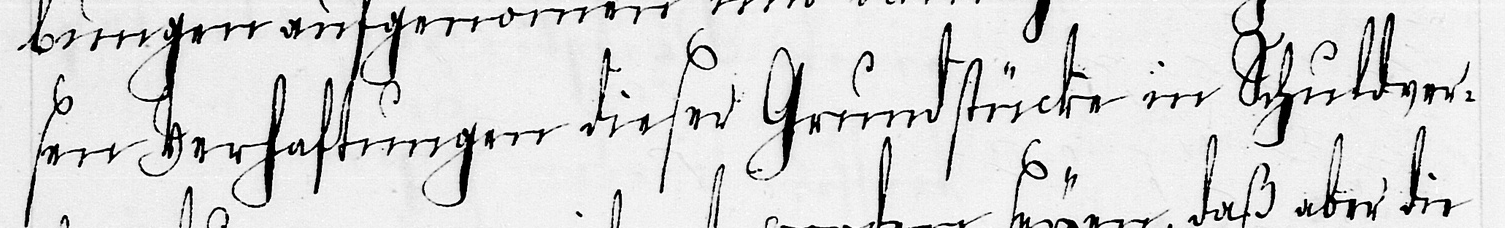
sen Verhaftungen dieser Grundstücke in Schuldver¬
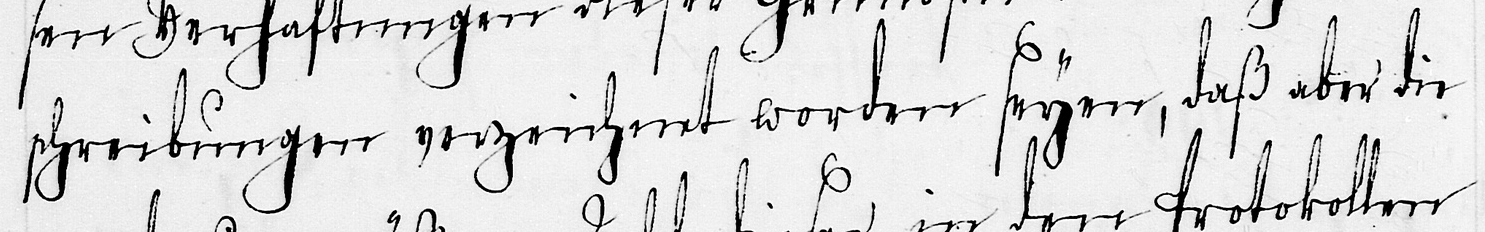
schreibungen verzeichnet worden seyen, daß aber die
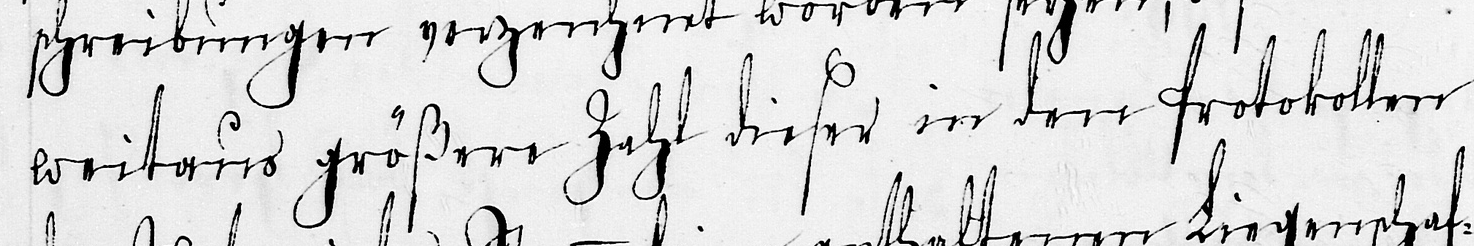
weitaus größere Zahl dieser in den Protokollen
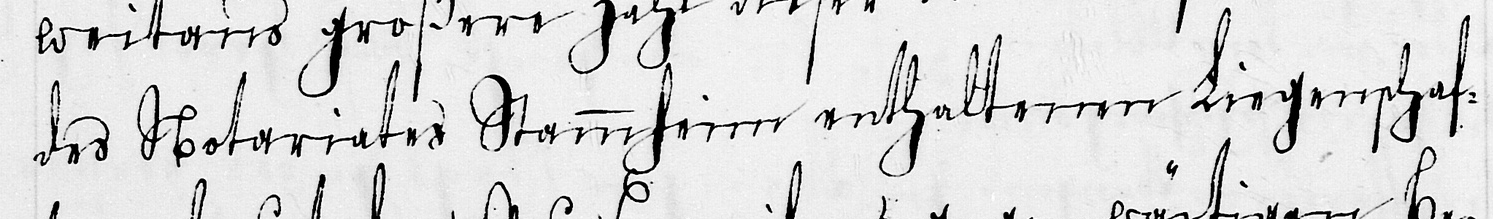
des Notariates Stammheim enthaltenen Liegenschaf¬
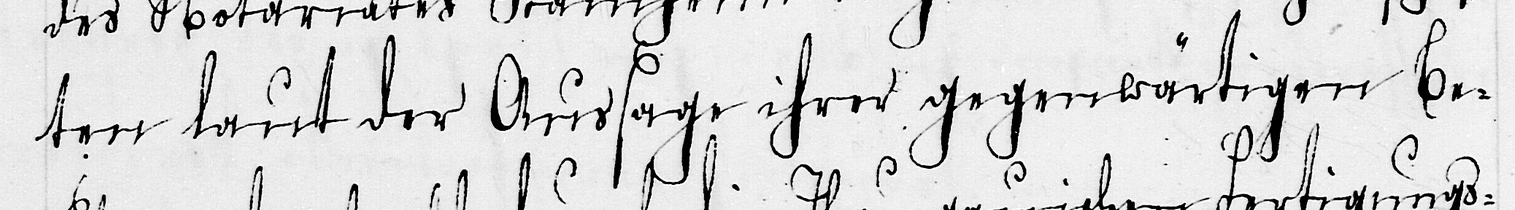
ten laut der Aussage ihrer gegenwärtigen Be¬
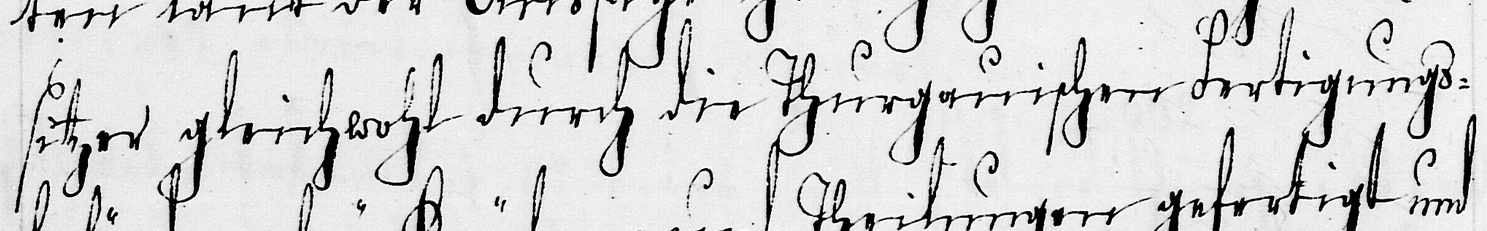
sitzer gleichwohl durch die Thurgauischen Feritungs¬
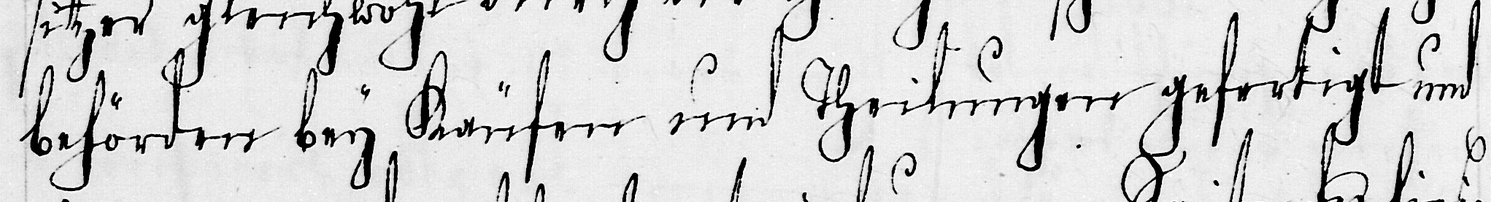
behörden bey Käufen und Theilungen gefertigt und
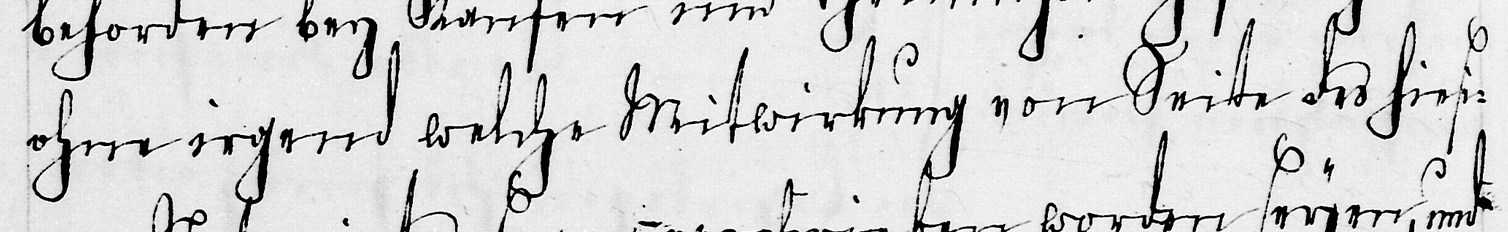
ohne irgend welche Mitwirkung von Seite des hiesi¬
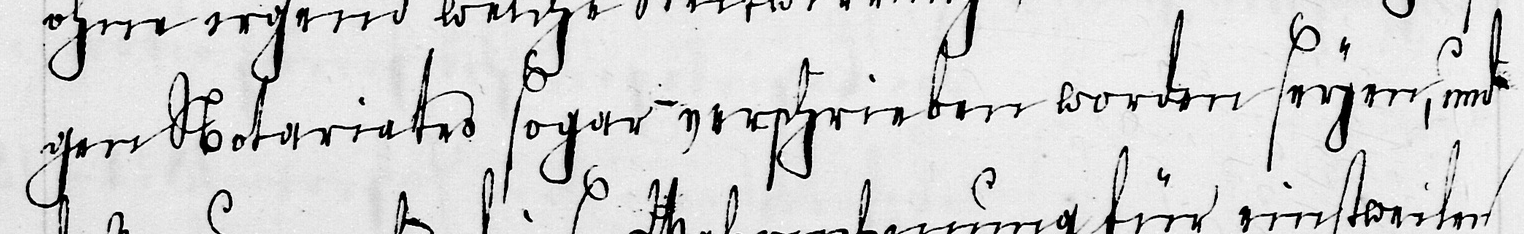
gen Notariates sogar verschrieben worden seyen, und
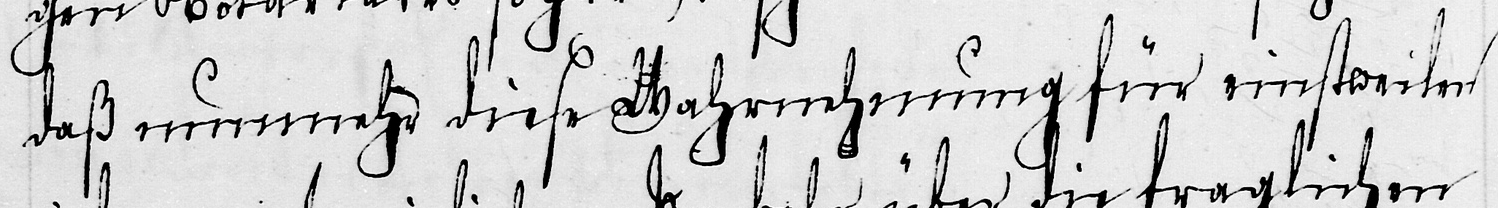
daß nunmehr diese Wahrnehmung für einstweilen
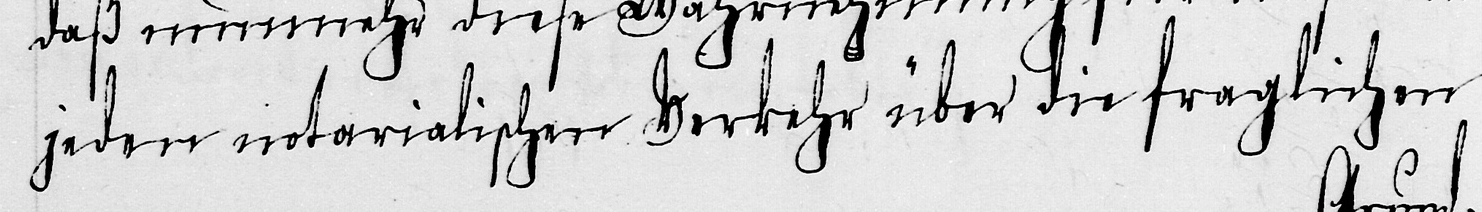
jeden notarialischen Verkehr über die fraglichen
